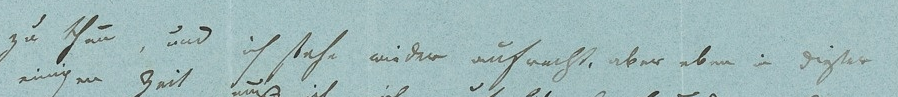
zu thun, und ich stehe wieder aufrecht, aber eben in dieser
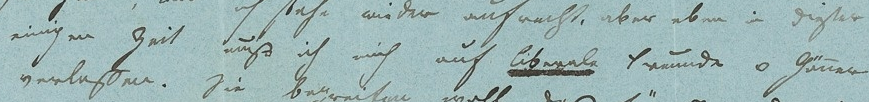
einigen Zeit muß ich mich auf liberale Freunde u Gönner
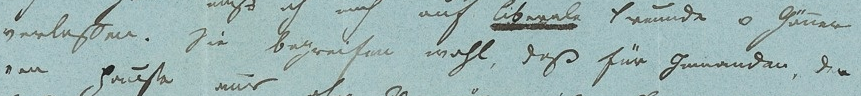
verlassen. Sie begreifen wohl, daß für Jemanden, der
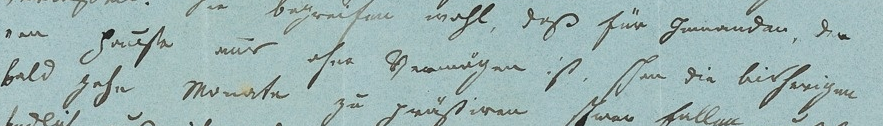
von Hause aus ohne Vermögen ist, schon die bisherigen
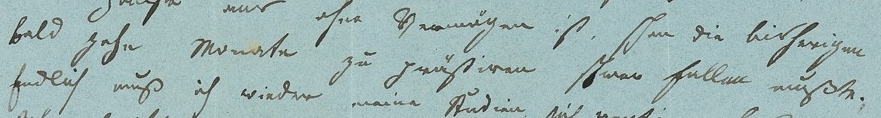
bald zehn Monate zu prästiren schwer fallen mußte.
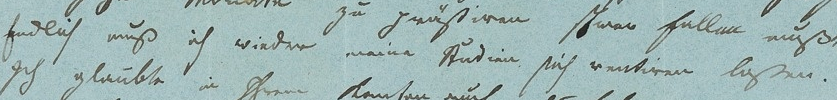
Endlich muß ich wieder meine Studien sich rentiren laßen.
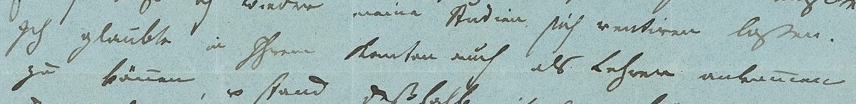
Ich glaubte in Ihrem Kanton auch als Lehrer ankommen
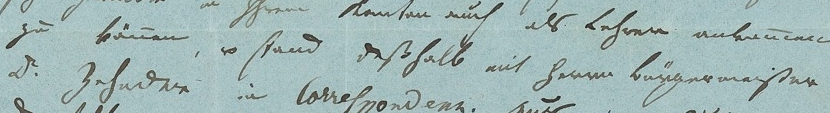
zu können, & stand deßhalb mit Herrn Bürgermeister
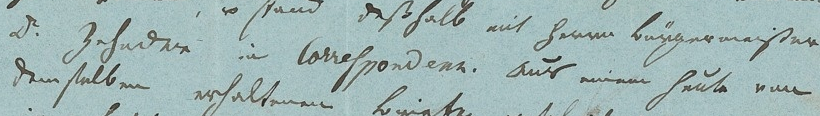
D Zehnder in Correspondenz. Aus einem heute von
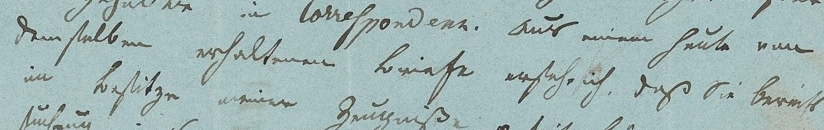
demselben erhaltenen Briefe ersehe ich, daß Sie bereits
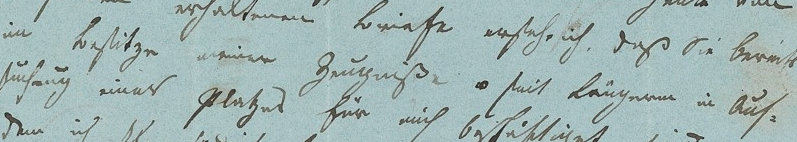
im Besitze meiner Zeugniße u seit Längerm in Aus-
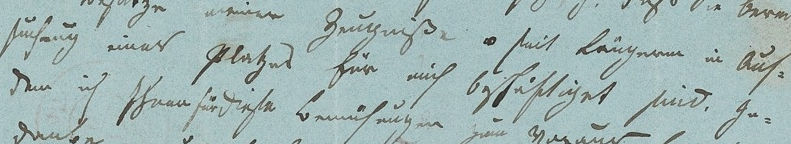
suchung eines Platzes für mich beschäftiget sind. In-
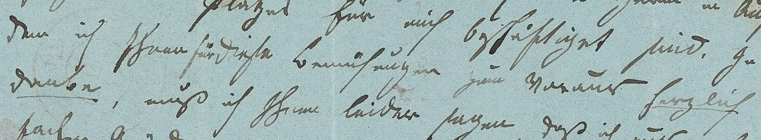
dem ich Ihnen für diese Bemühungen zum Voraus herzlich
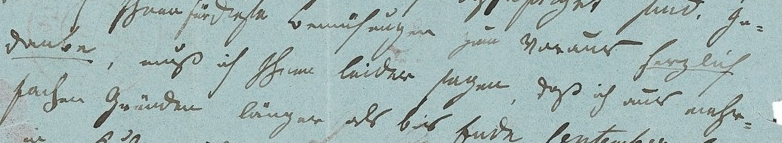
danke, muß ich Ihnen leider sagen, daß ich aus mehr-
